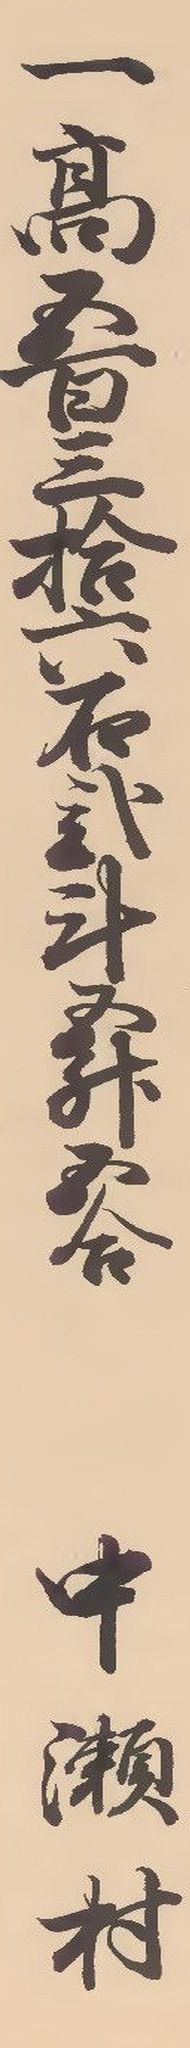一高五百三拾六石弐斗五升五合中瀬村

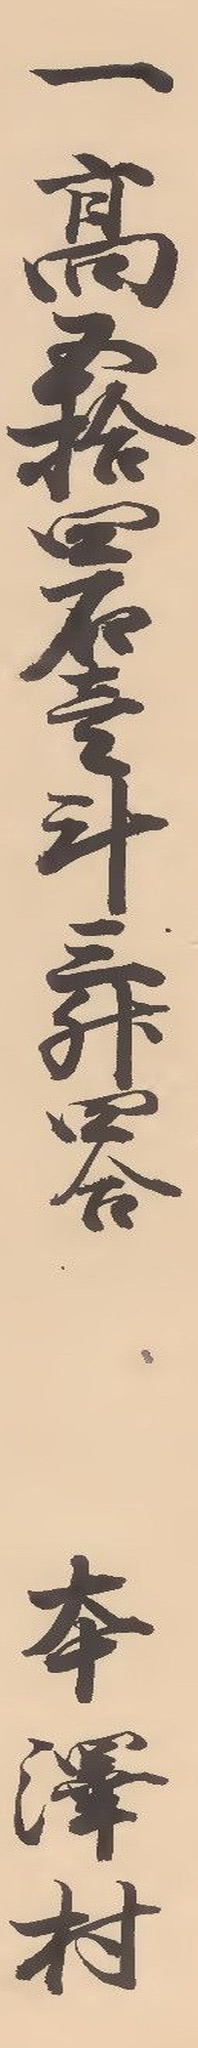一高五拾四石壱斗三升四合本沢村
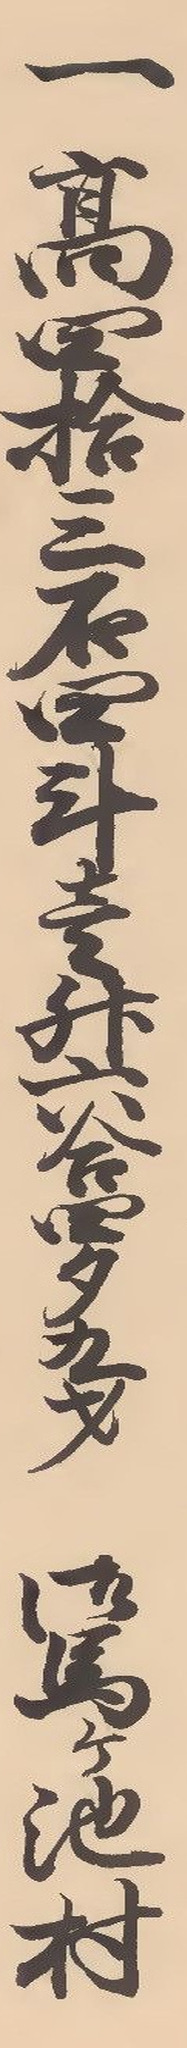一高四拾三石四斗壱升六合四勺九才御馬ヶ池村
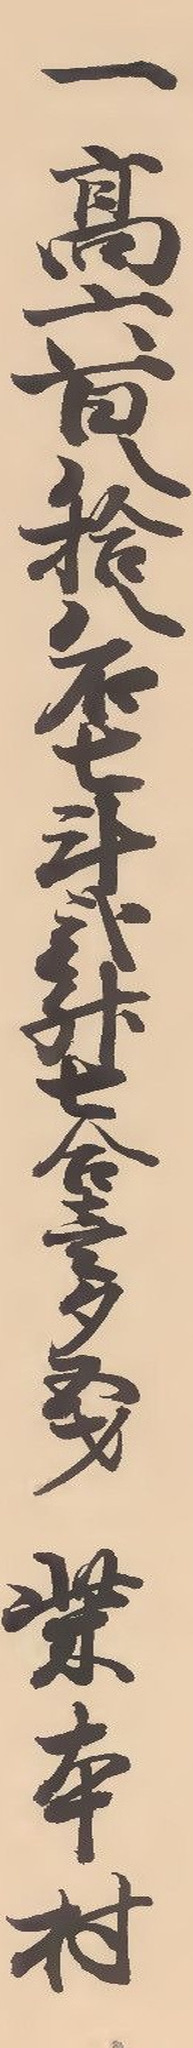一高六百八拾八石七斗弐升七合壱勺五才柴本村
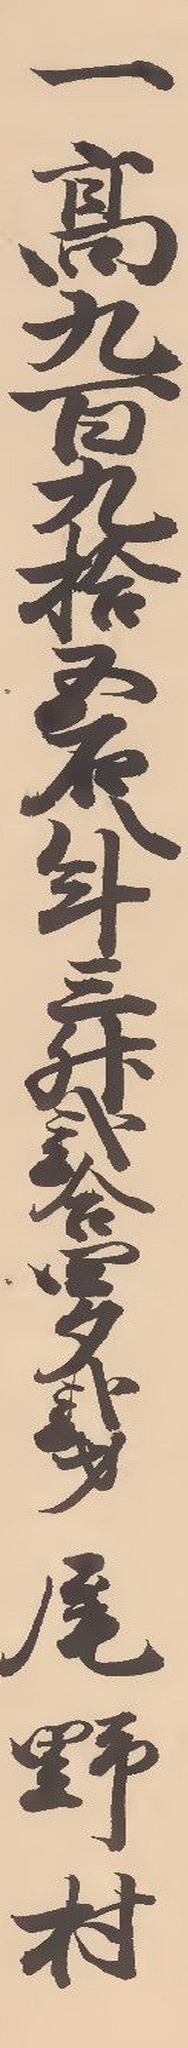一高九百九拾五石八斗三升弐合四勺弐才尾野村
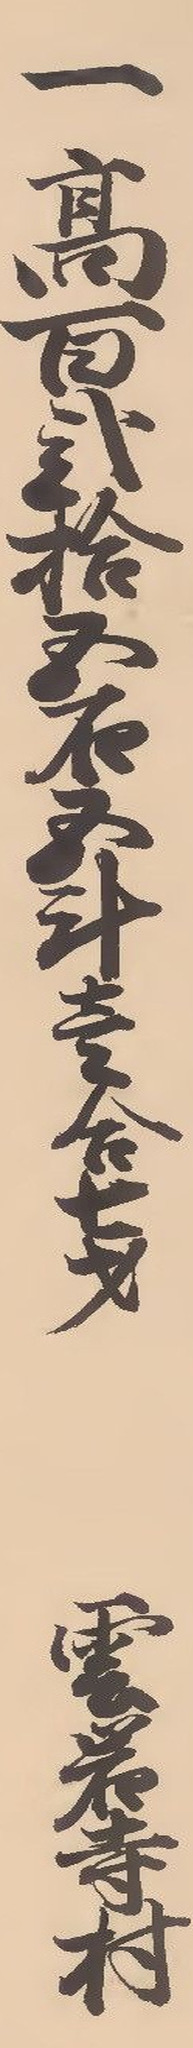一高百弐拾五石五斗壱合七才雲岩寺村
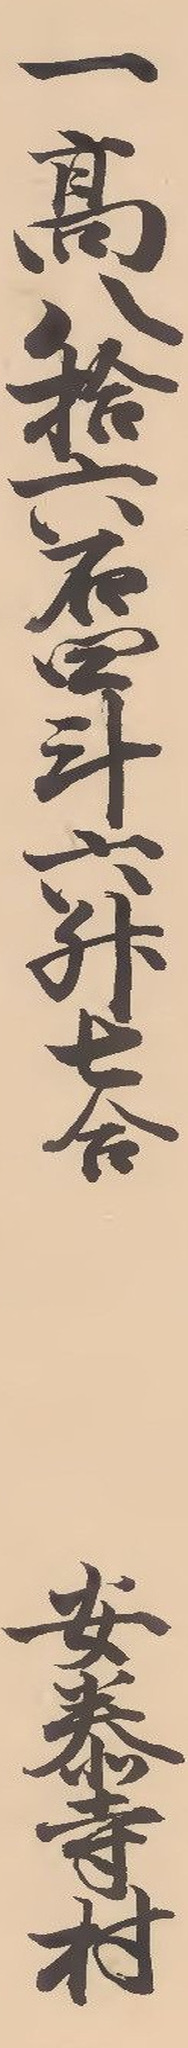一高八拾六石四斗六升七合安泰寺村
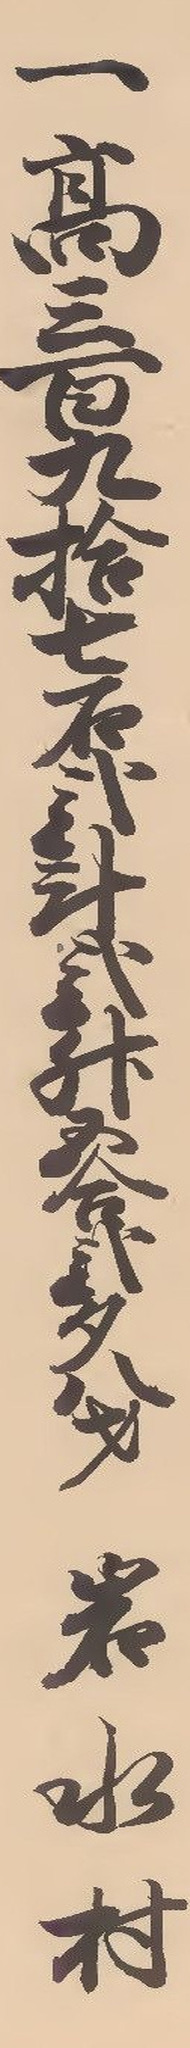一高三百九拾七石弐斗弐升五合弐勺八才岩水村
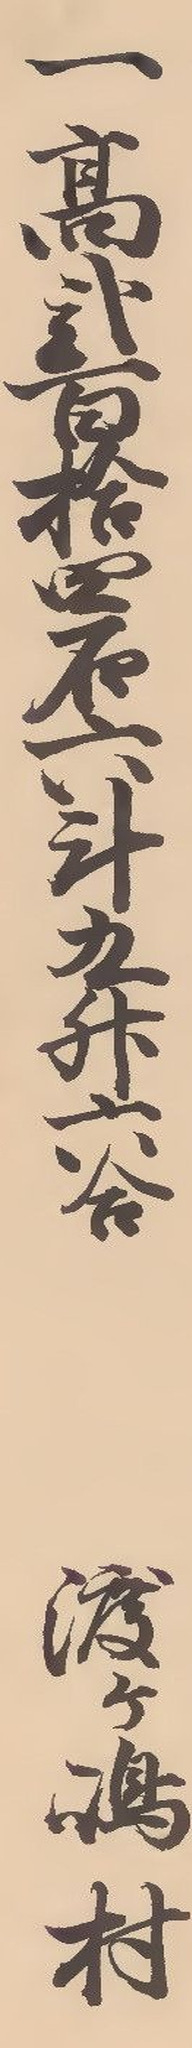一高弐百拾四石六斗九升六合渡ヶ島村

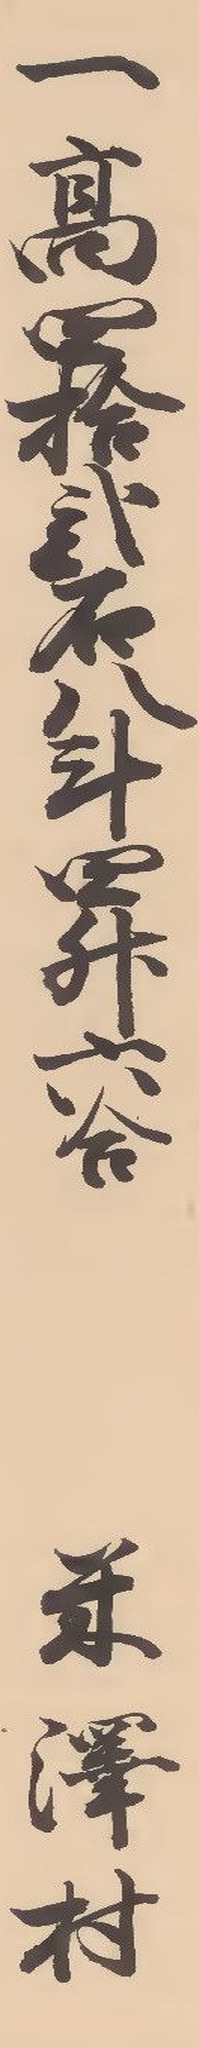一高四拾弐石八斗四升六合米沢村
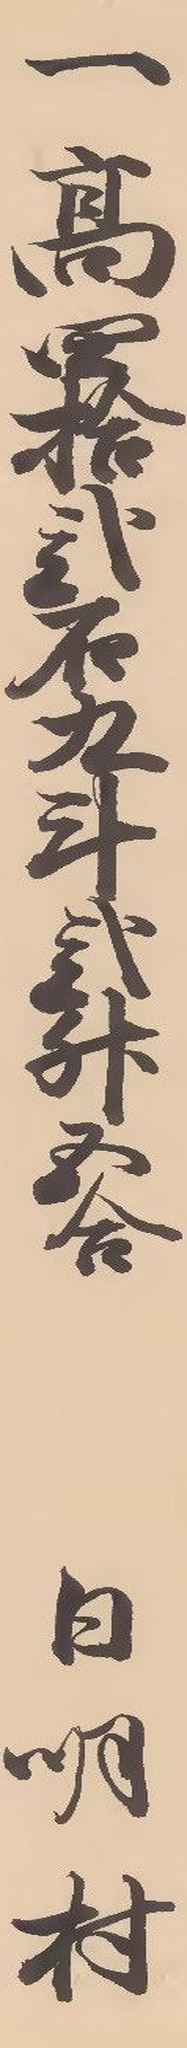一高四拾弐石九斗弐升五合日明村
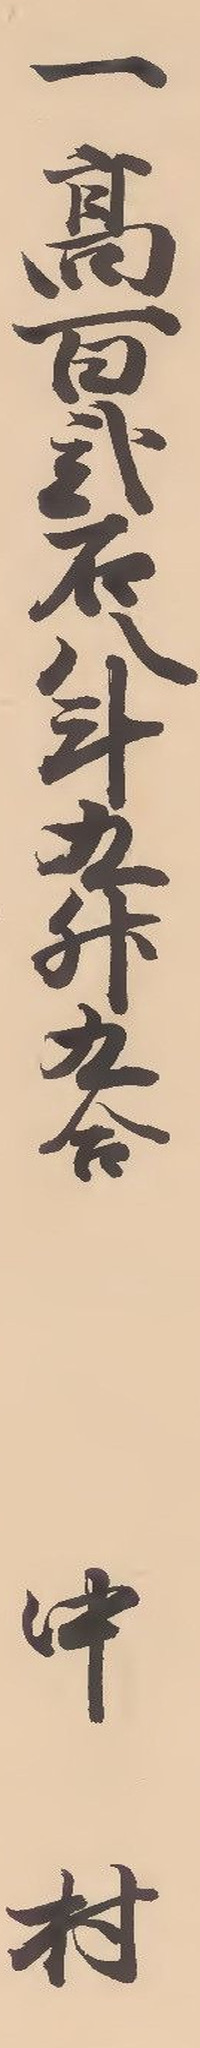一高百弐石八斗九升九合中村
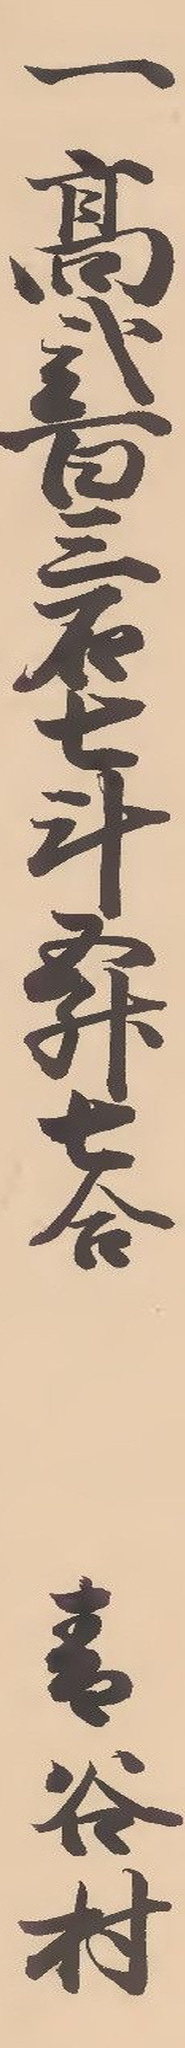一高弐百三石七斗五升七合青谷村
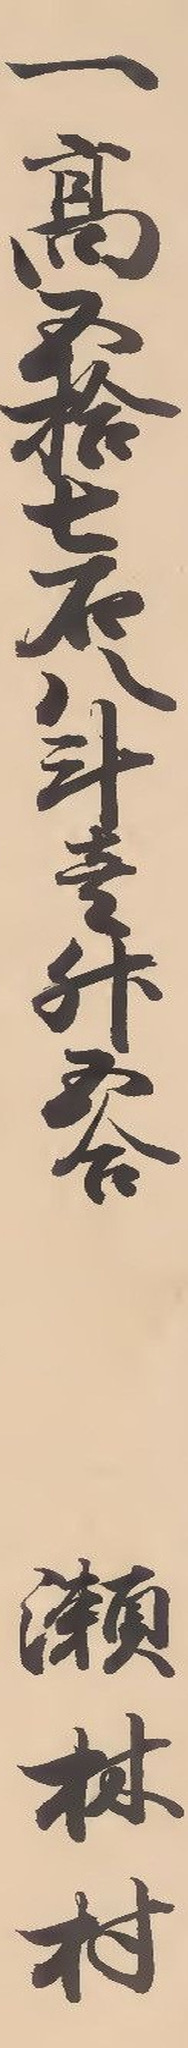一高五拾七石八斗壱升五合瀬林村
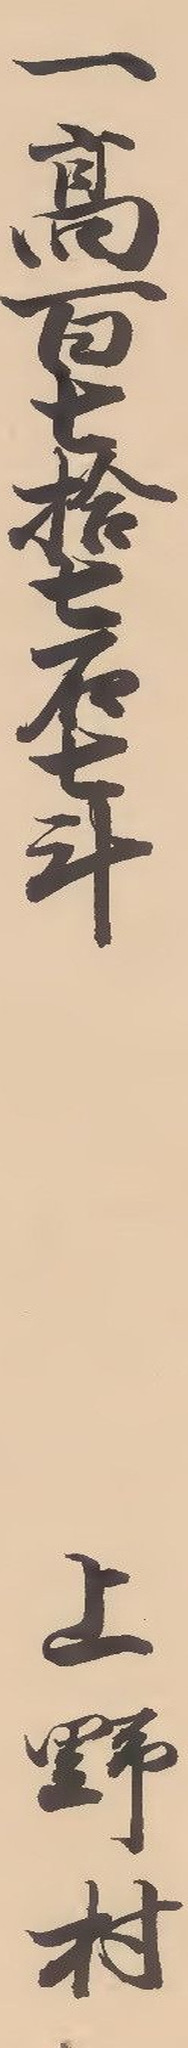一高百七拾七石七斗上野村
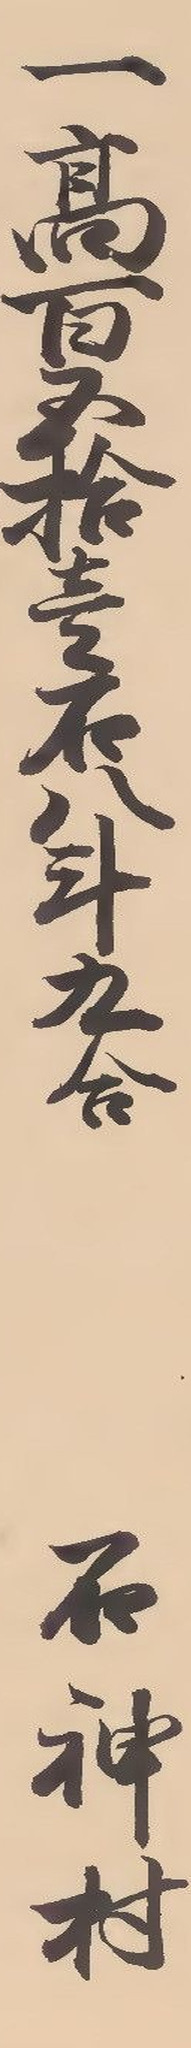一高百五拾壱石八斗九合石神村
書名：遠江国郷帳
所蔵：国立公文書館 National Archives of Japan
